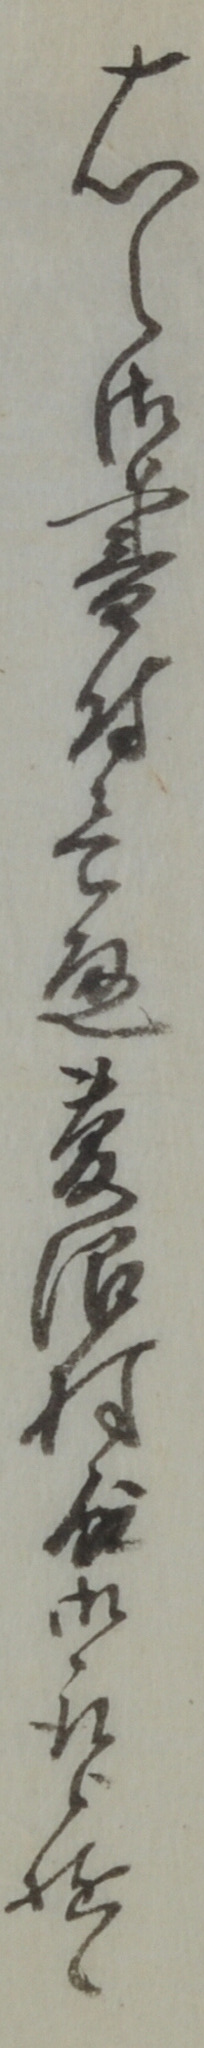右之御書付壱通菅沼村より御取被遊候
